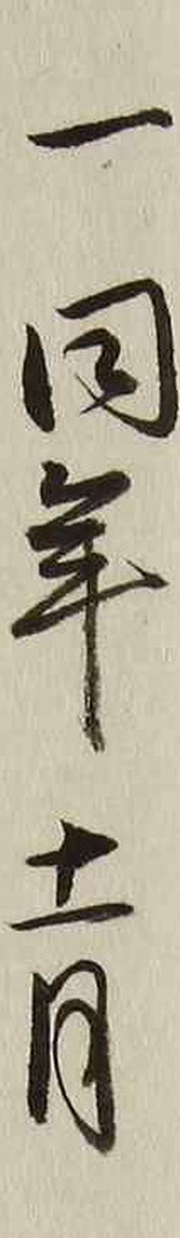一同年十一月
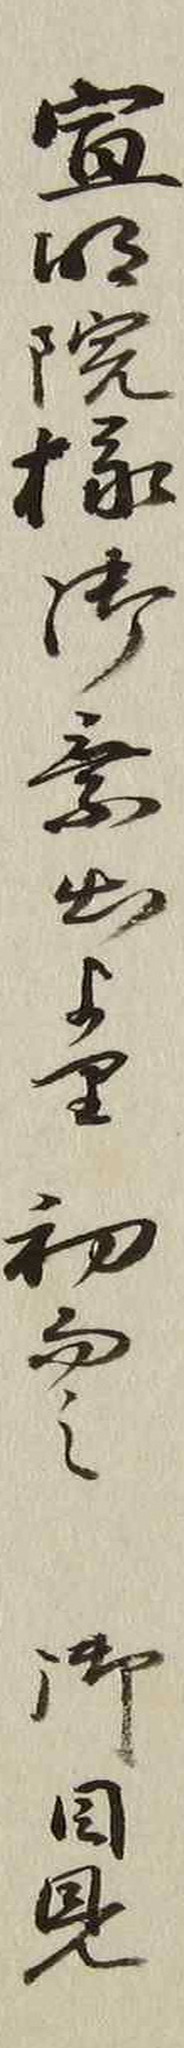宣明院様御乗出より初而之御目見
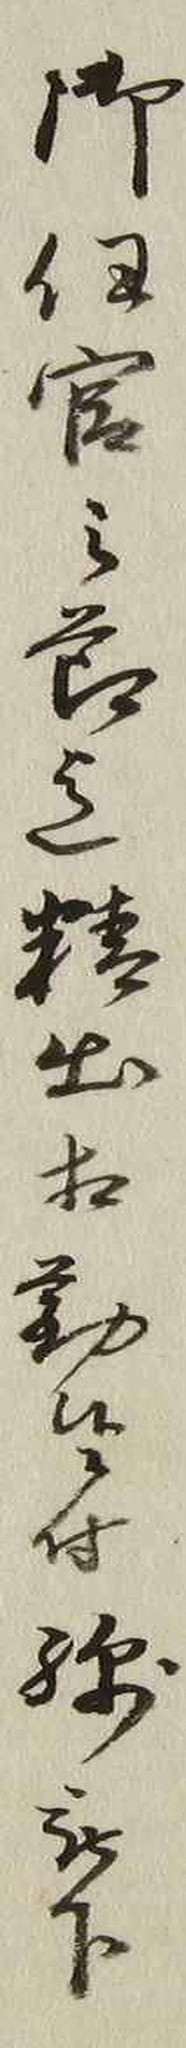御任官之節迄精出相勤候ニ付綿被下
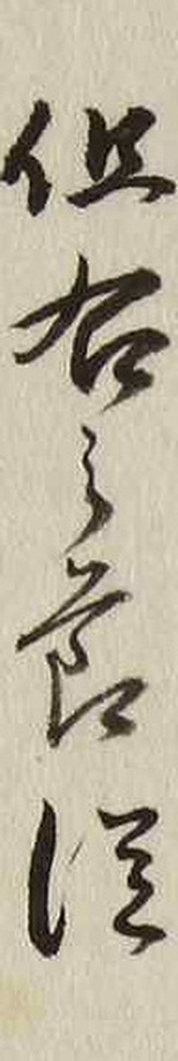但右之節従
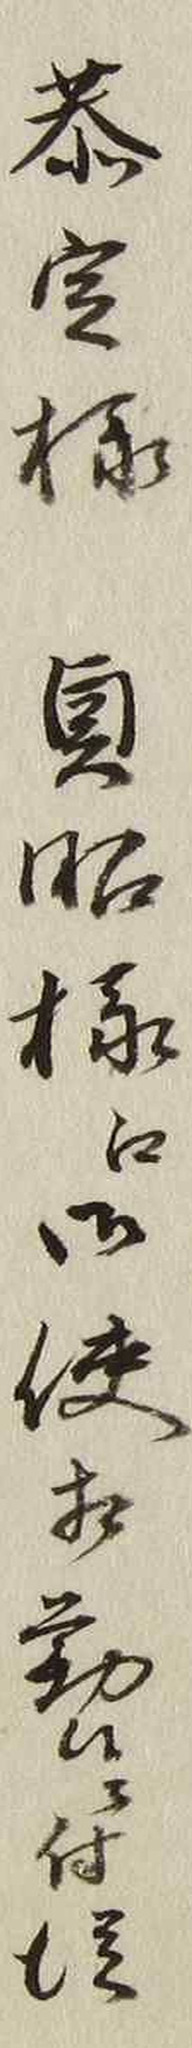恭定様貞昭様え御使相勤候ニ付従
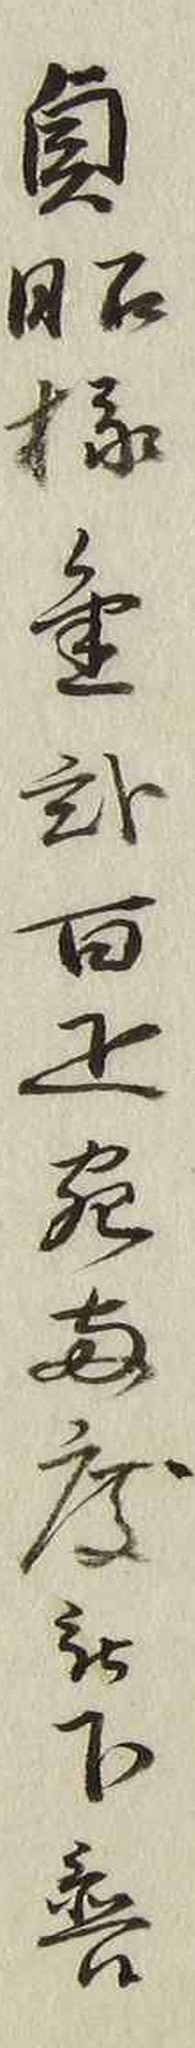貞昭様金弐百疋宛両度被下置候
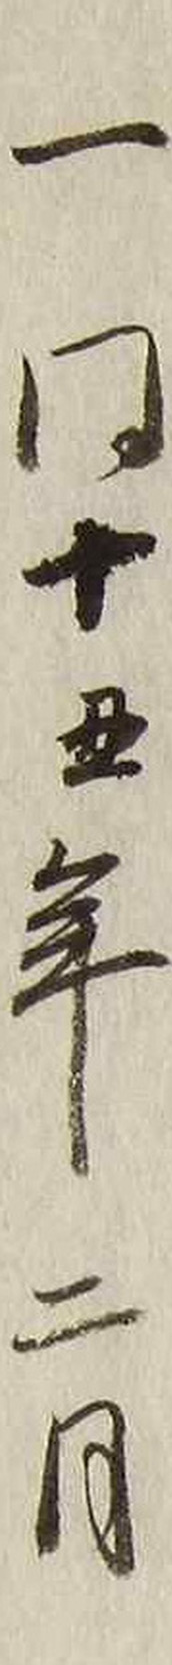一同十丑年二月
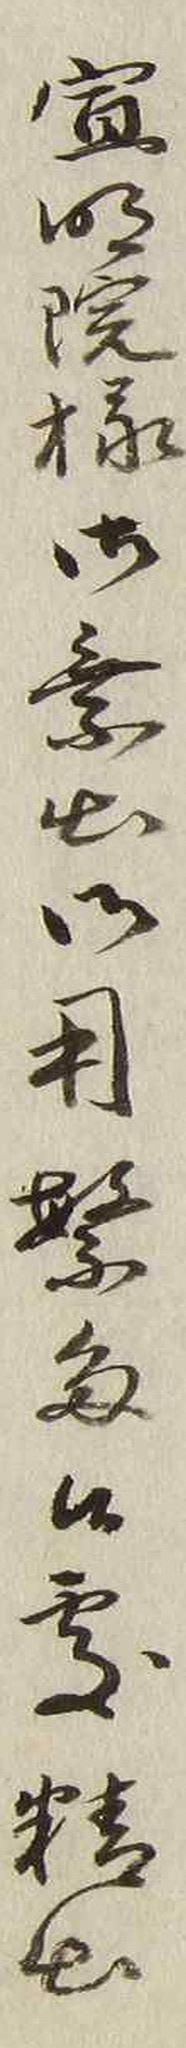宣明院様御乗出御用繫多候処精出

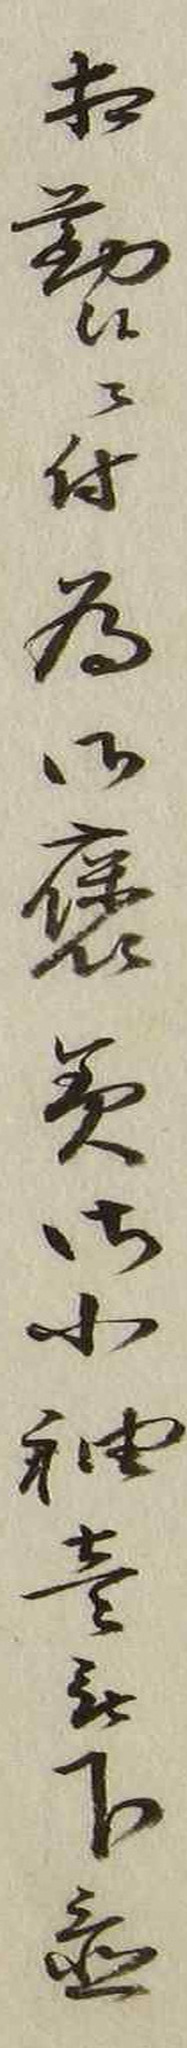相勤候ニ付為御褒美御小袖壱被下置
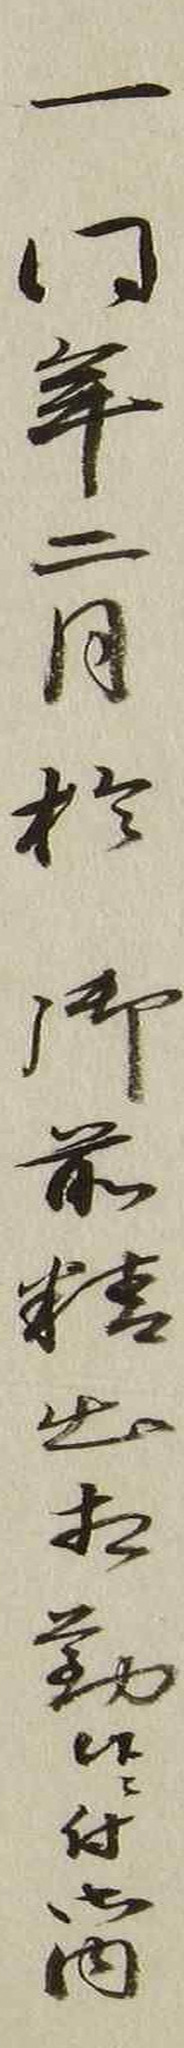一同年二月於御前精出相勤候ニ付御内
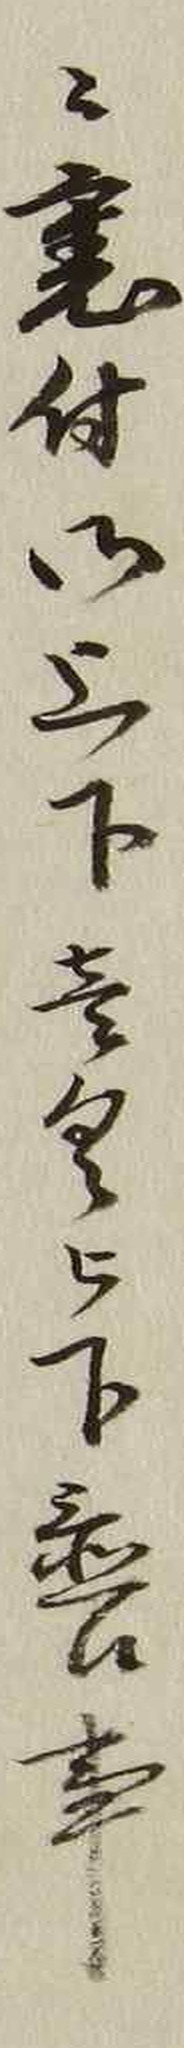々裏付御上下壱具被下置候事
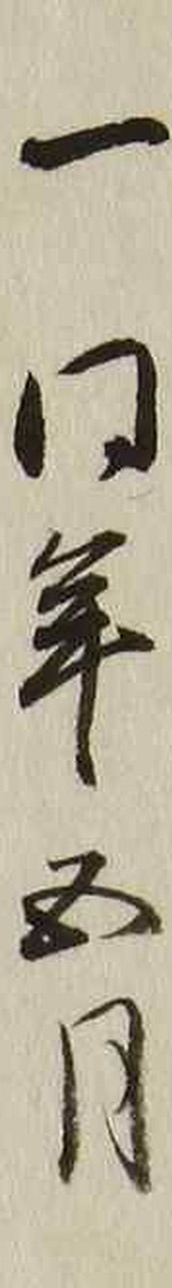一同年五月
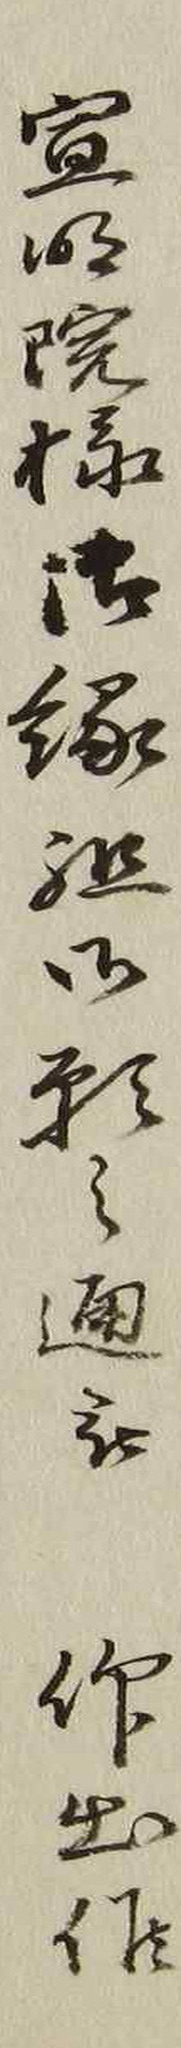宣明院様御縁組御願之通被仰出候
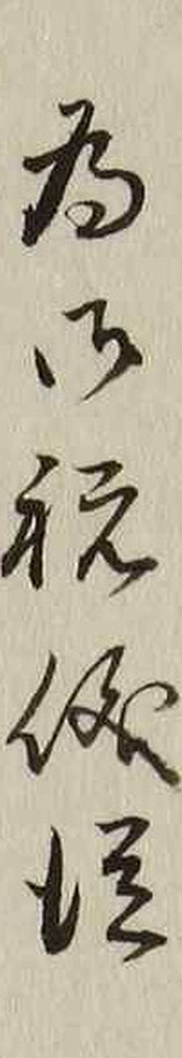為御祝儀従
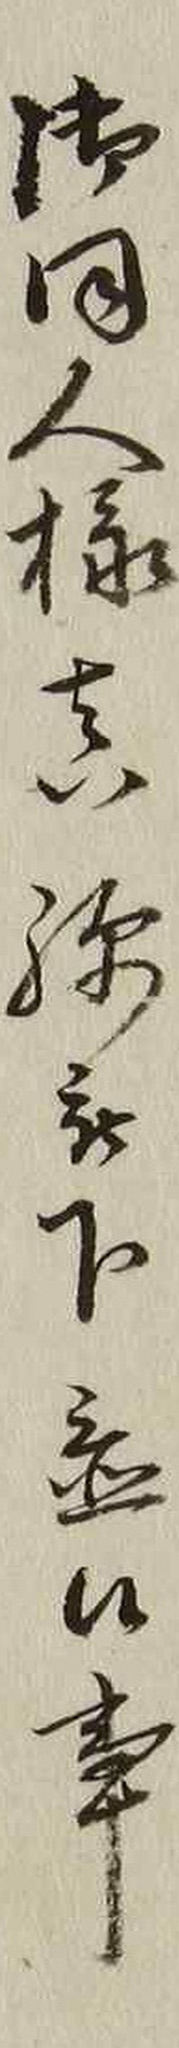御同人様真綿被下置候事
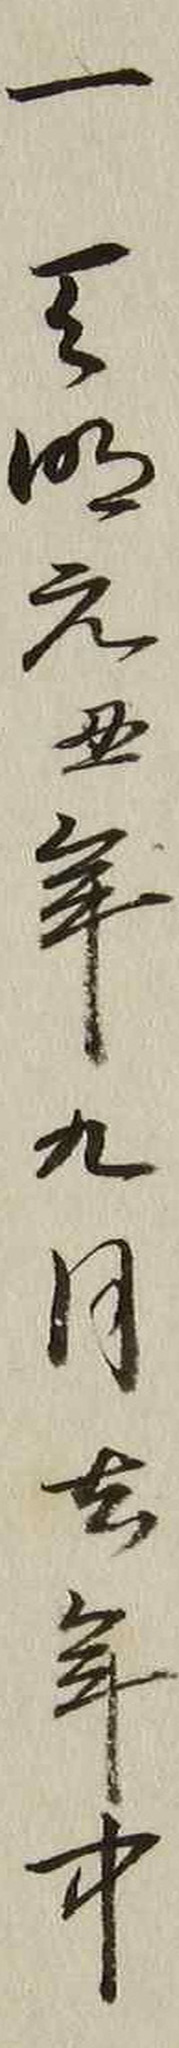一天明元丑年九月去年中
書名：諸士系譜　巻之160　な之部2
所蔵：会津若松市立会津図書館
